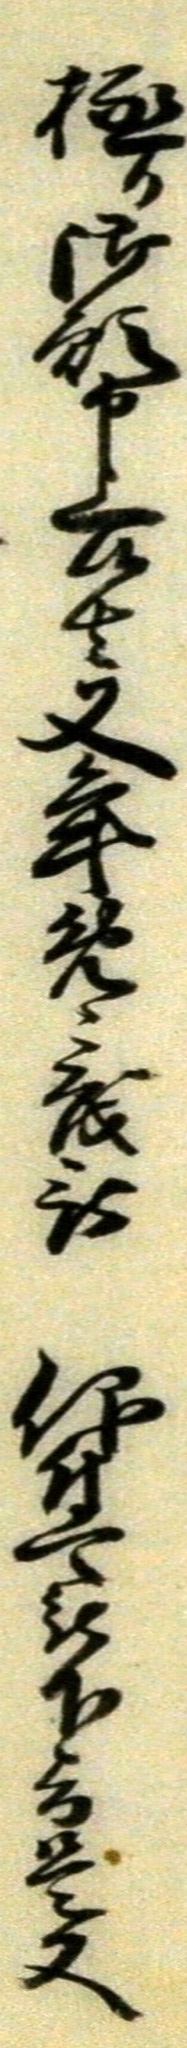極り御願申上候者又年免ニ茂被仰付可被下旨是又
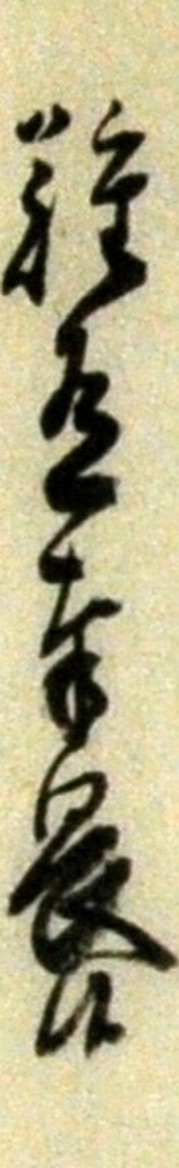難有奉畏候
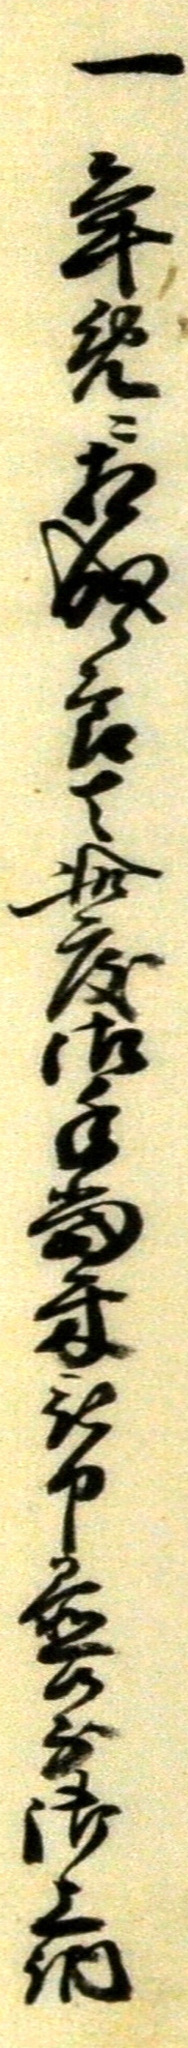一年免ニ相成候節者此度御手当米被申置候分御上納

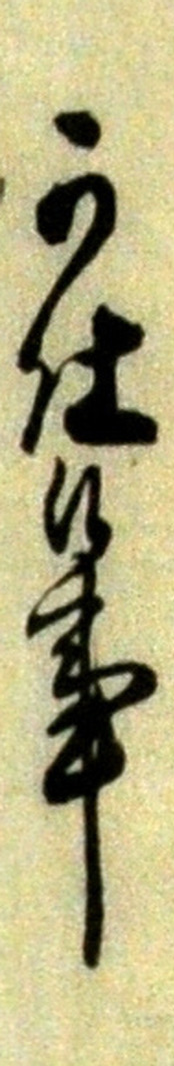可仕候事
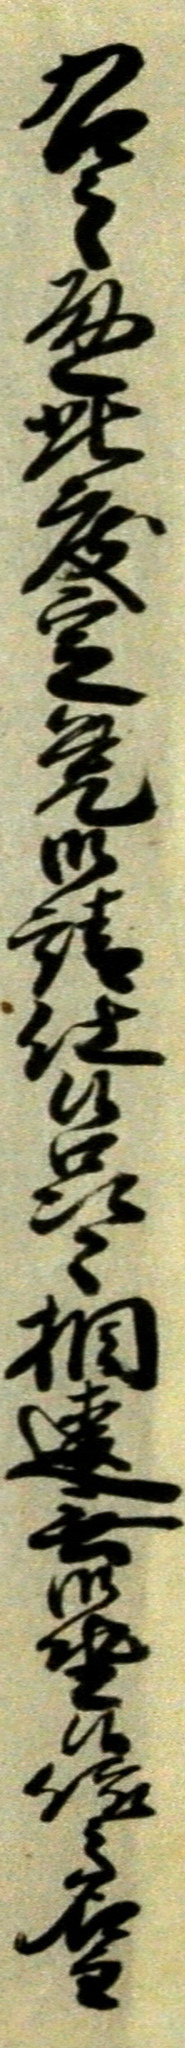右之通此度定免御請仕候品々相違無御座候依之名主
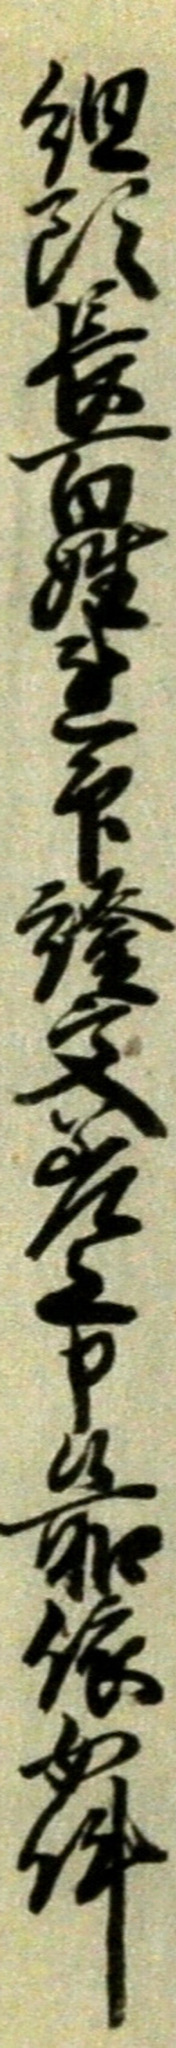組頭長百姓連印証文差上申候所依如件
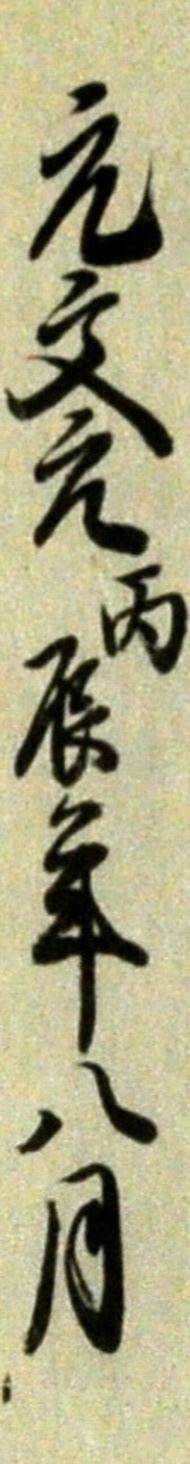元文元丙辰年八月
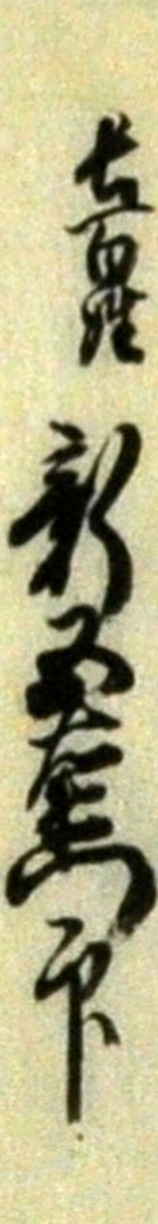長百姓治右衛門印
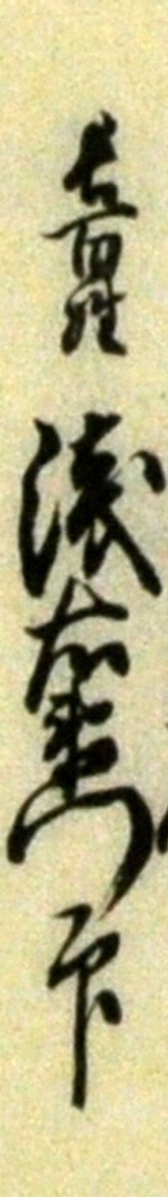長百姓治右衛門印

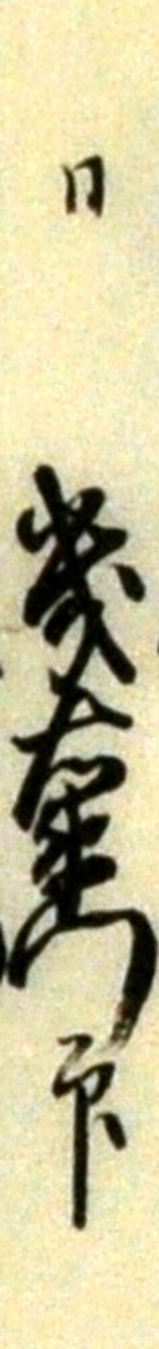同三右衛門印
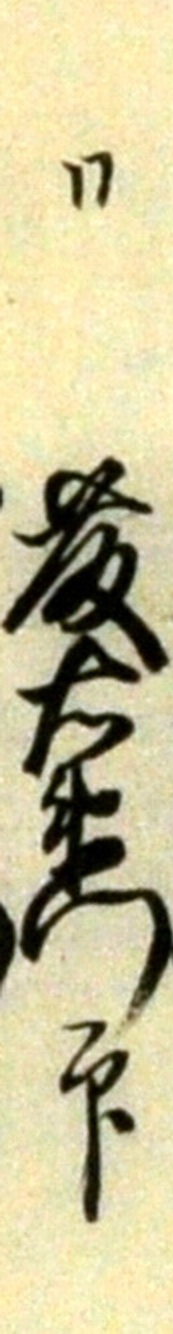同三右衛門印

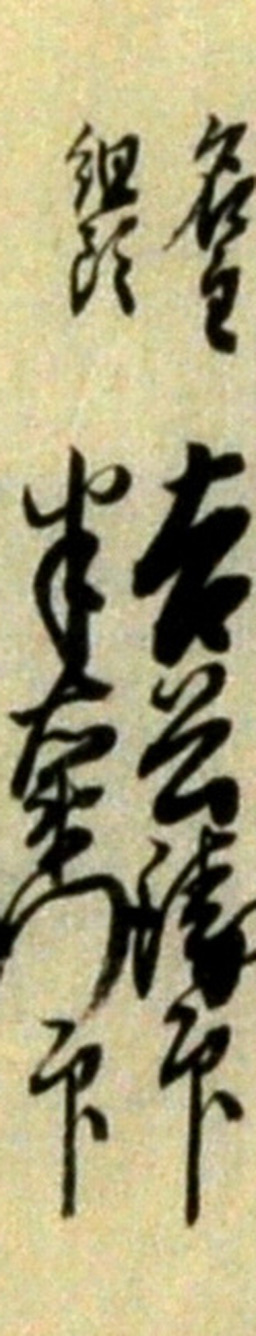組頭伴右衛門印
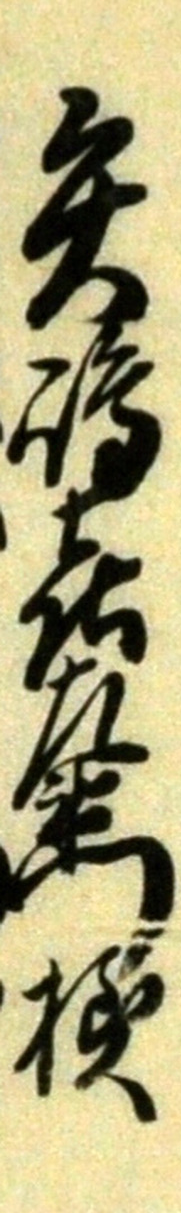矢嶋喜左衛門様
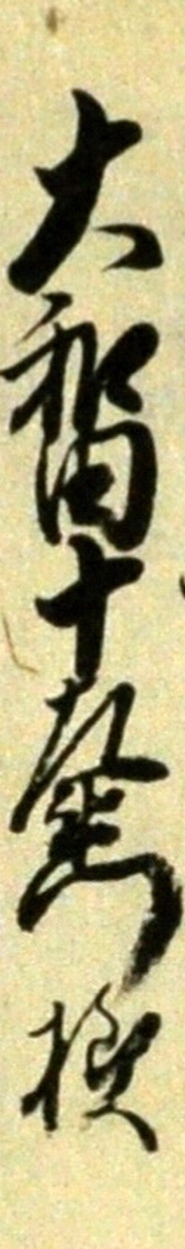大和田十左衛門様
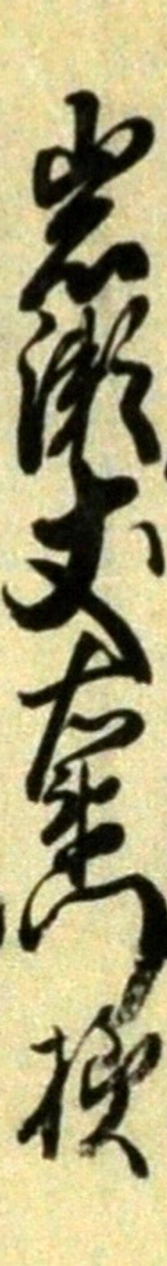岩瀬丈右衛門様
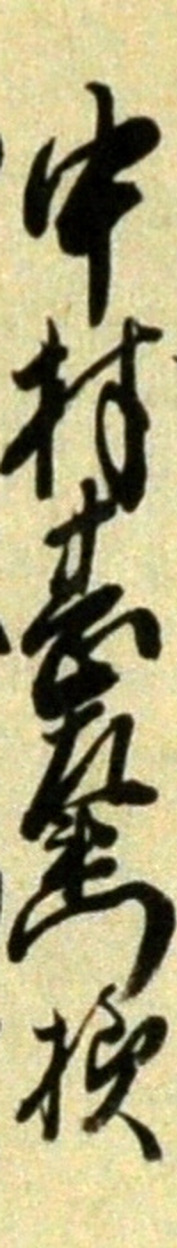中村甚左衛門様
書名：留書
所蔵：伊那市立高遠町図書館・合同会社AMANE
